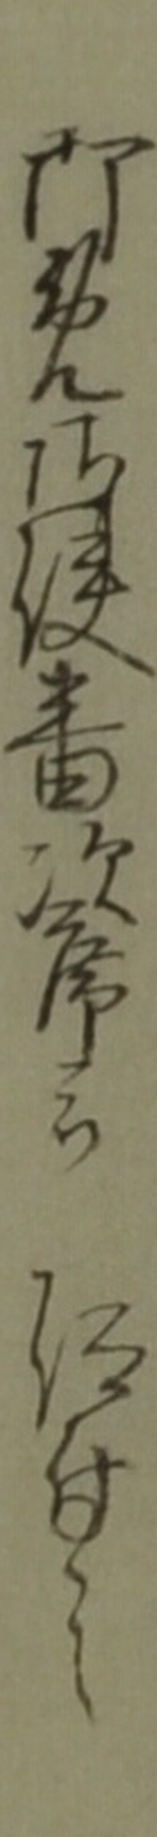御免御使番次席被仰付之
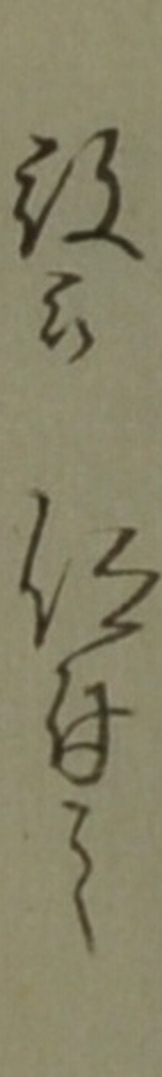役被仰付之
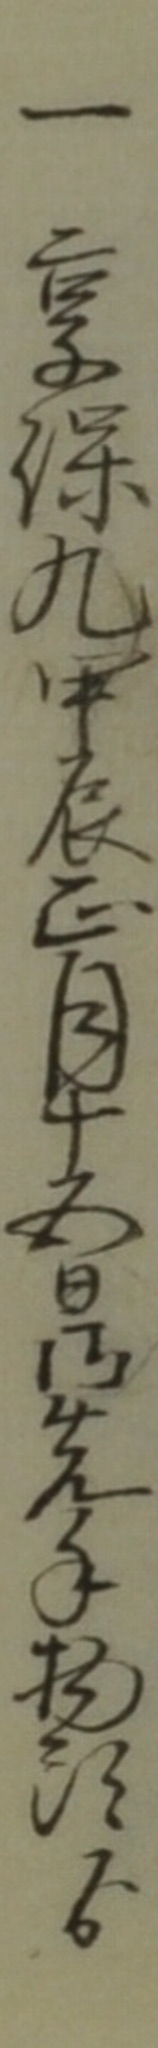一享保九甲辰正月十五日御先手物頭ゟ
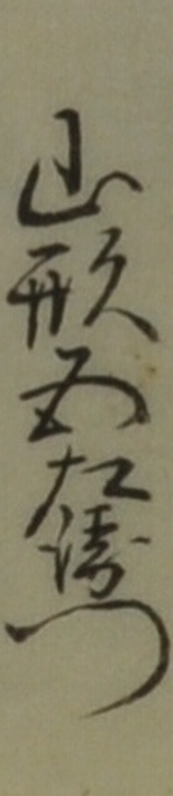山形五左衛門
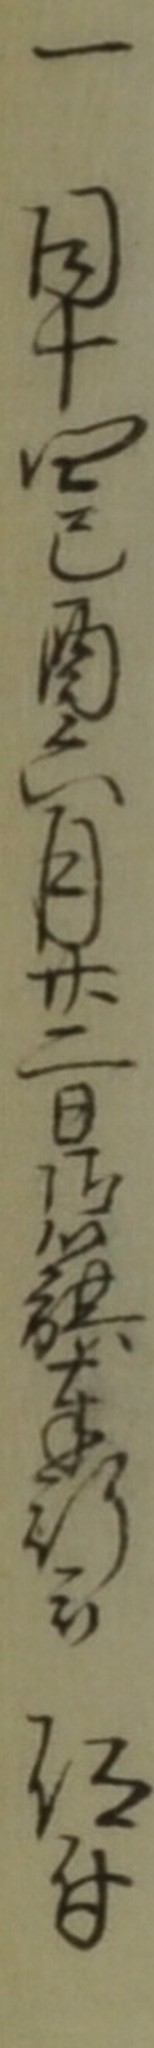一同十四己酉六月廿二日御籏奉行被仰付
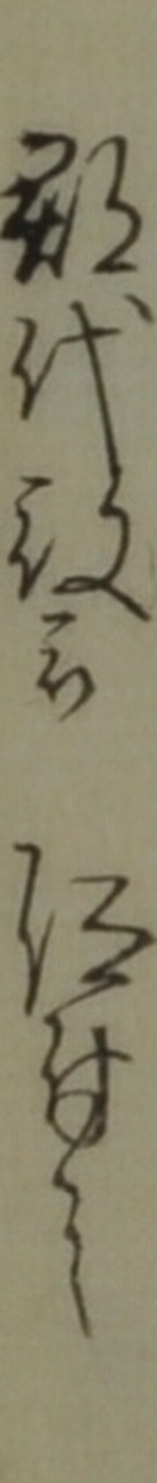郡代役被仰付之
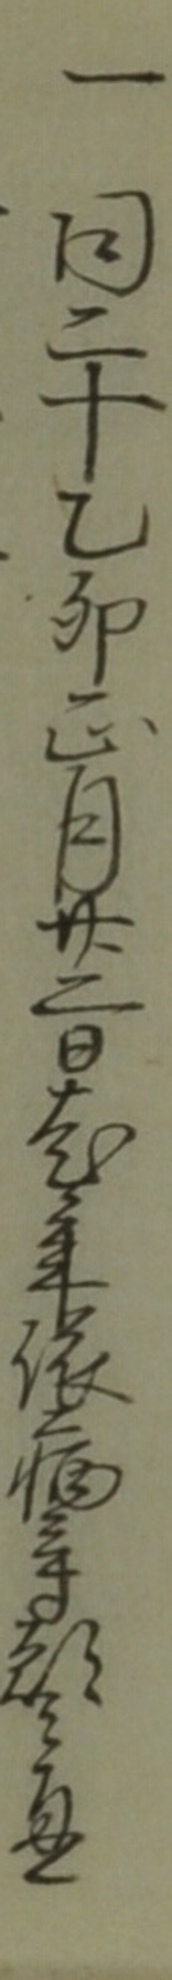一同二十乙卯正月廿二日老年依病気願之通
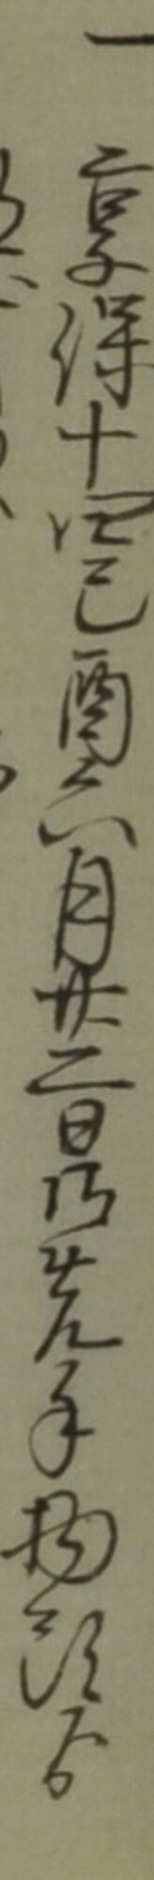一享保十四己酉六月廿二日御先手物頭ゟ
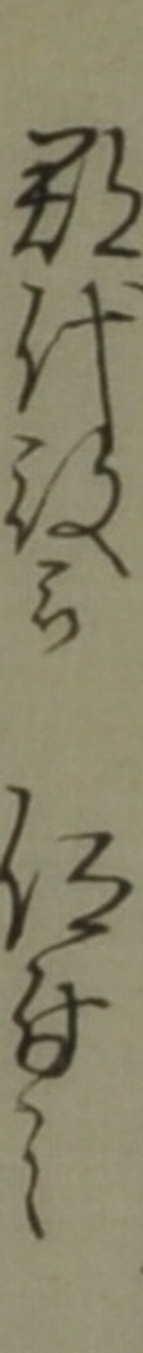郡代役被仰付之
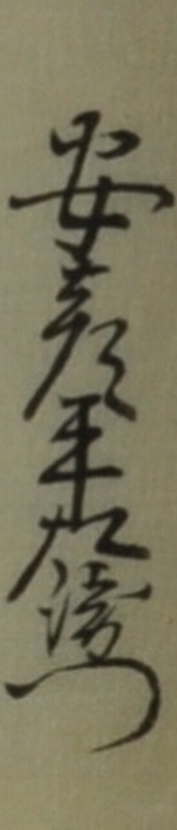康彦平左衛門
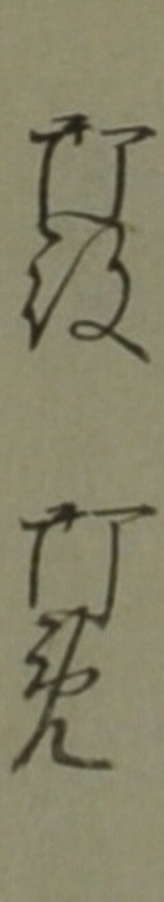御役御免
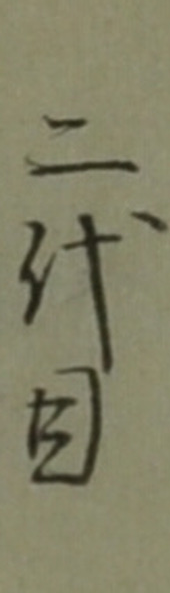二代目
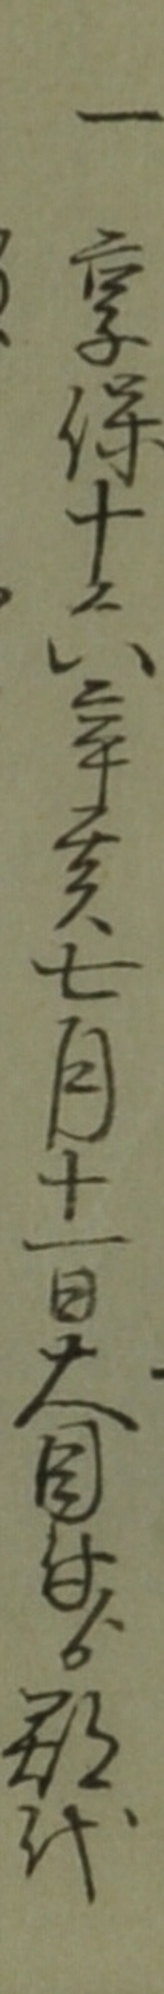一享保十六辛亥七月十一日大目付ゟ郡代
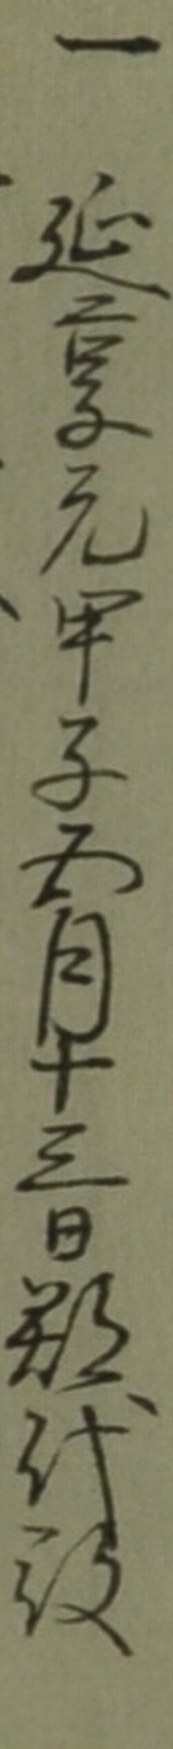一延享元甲子五月十三日郡代役
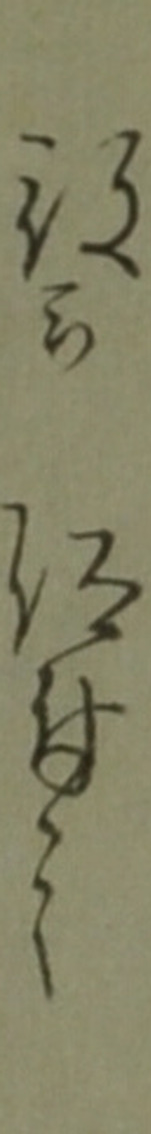役被仰付之
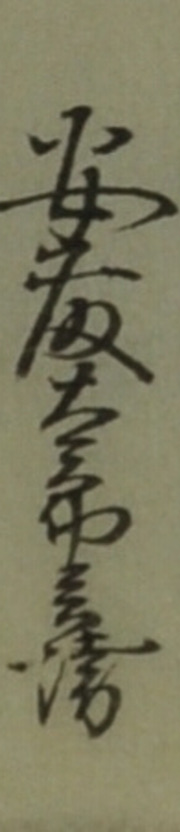安藤太郎兵衛
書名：諸御役代々録（二）
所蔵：伊那市立高遠町図書館・合同会社AMANE
